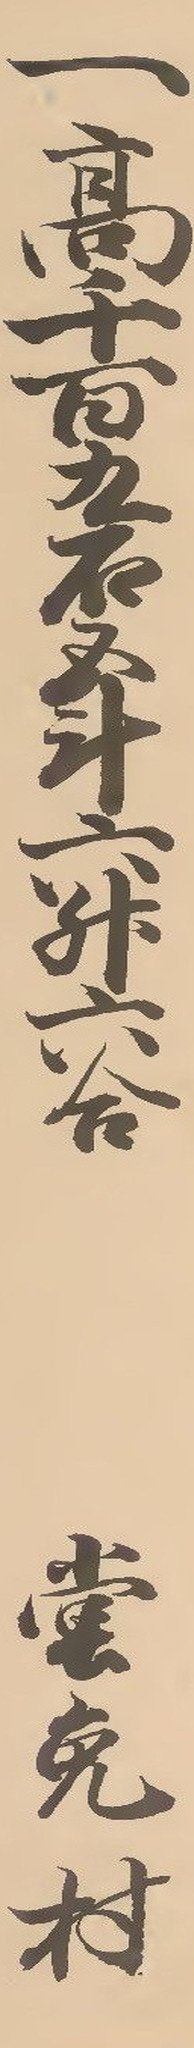一髙千百九石五斗六升六合堂免村
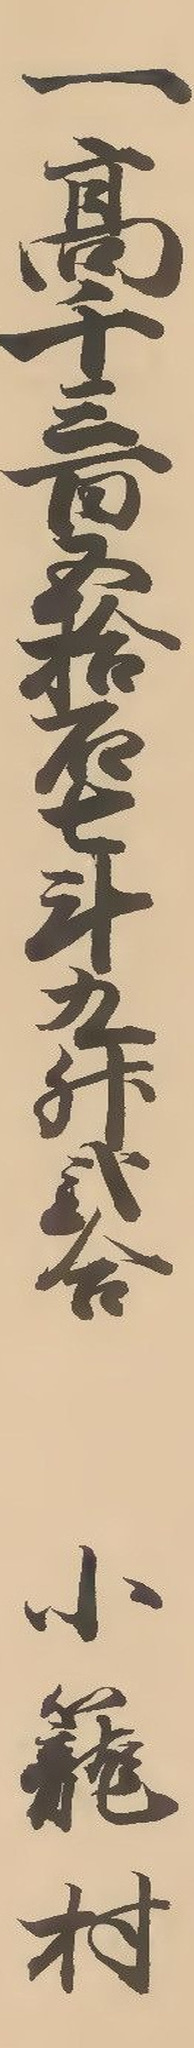一髙千三百五拾石七斗九升弐合小籠村
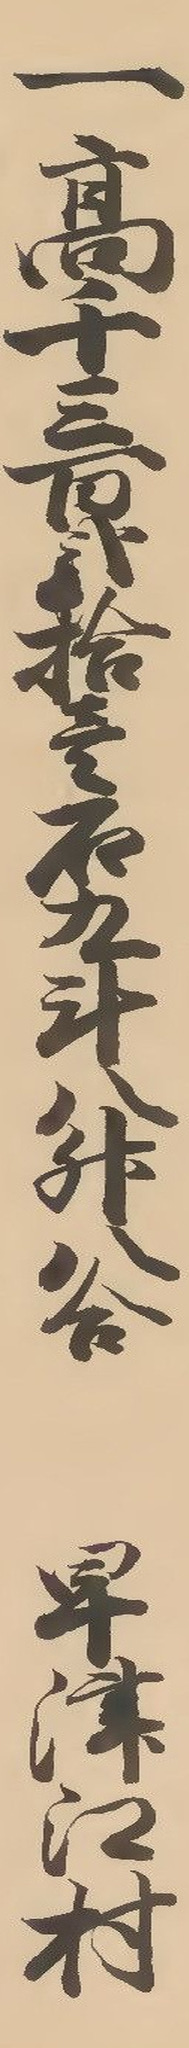一髙千三百弐拾壱石九斗八升八合早津江村
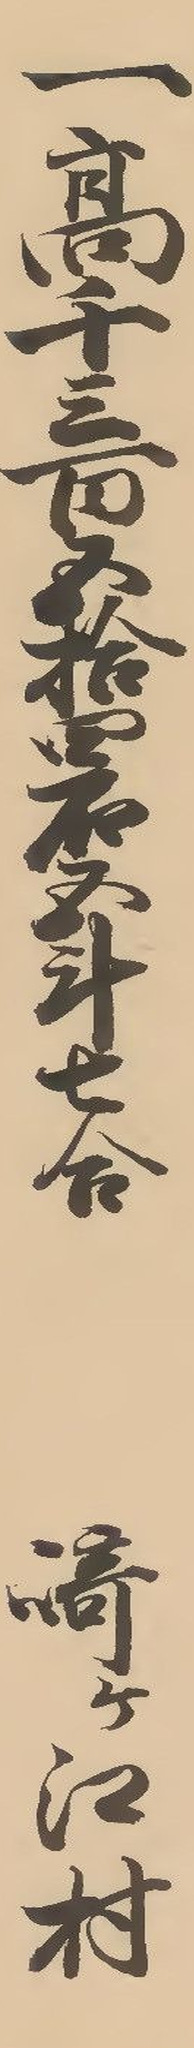一髙千三百五拾四石五斗七合崎ケ江村

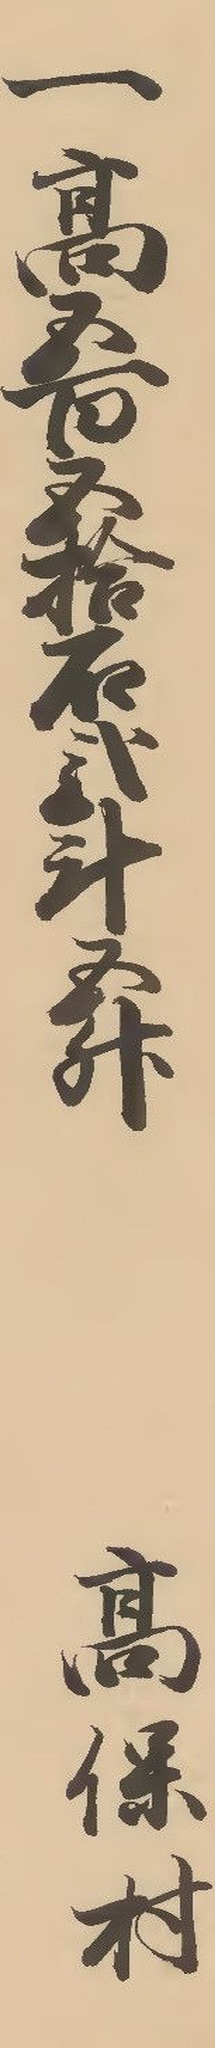一髙五百五拾石弐斗五升髙保村
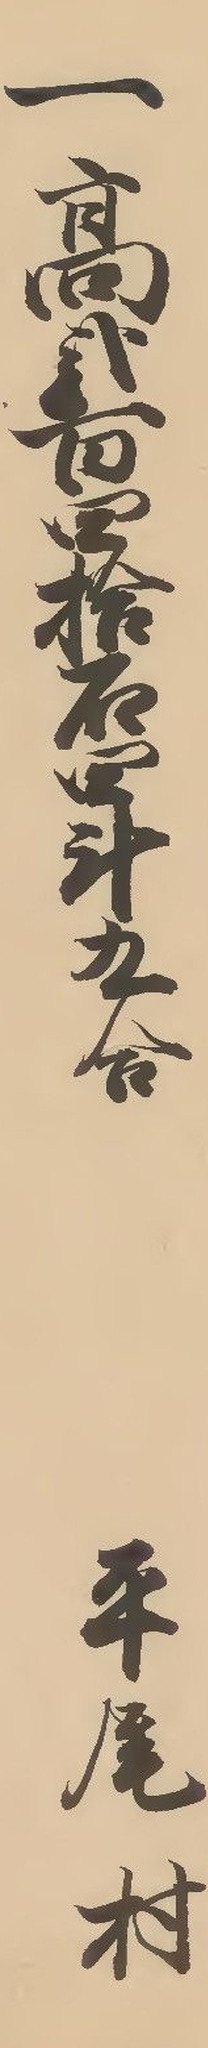一髙弐百四拾石四斗九合平尾村
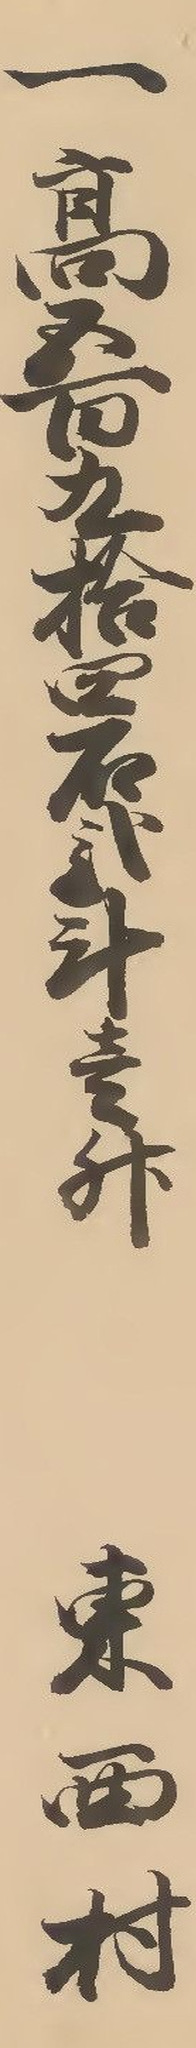一髙五百九拾四石弐斗壱升東西村
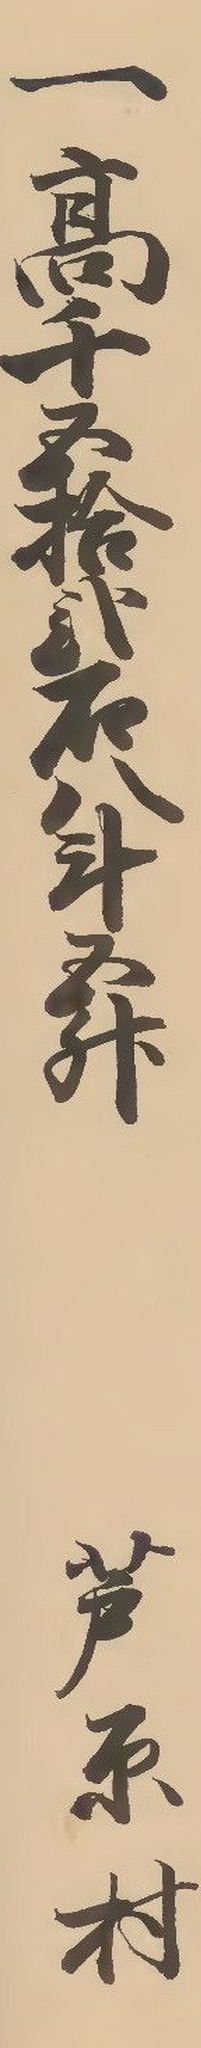一髙千五拾弐石八斗五升芦原村
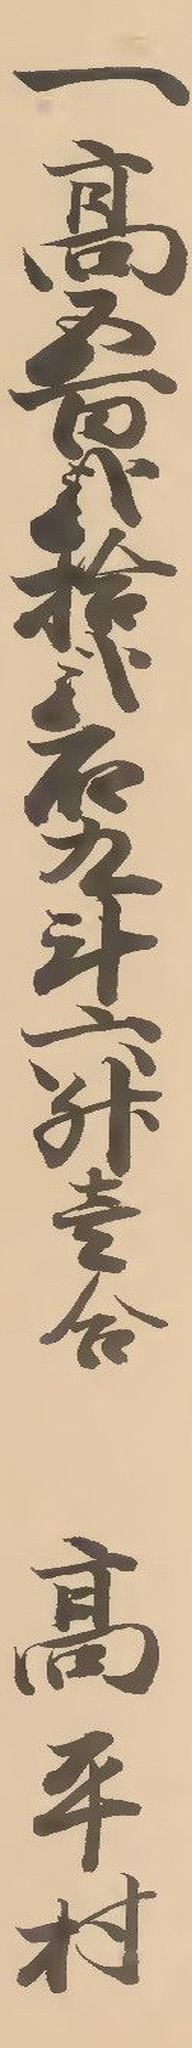一髙五百弐拾弐石九斗六升壱合髙平村
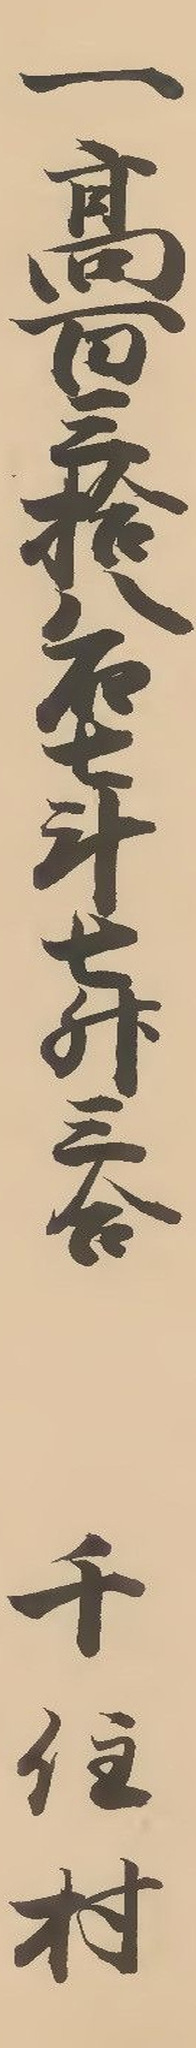一髙百三拾八石七斗七升三合千住村
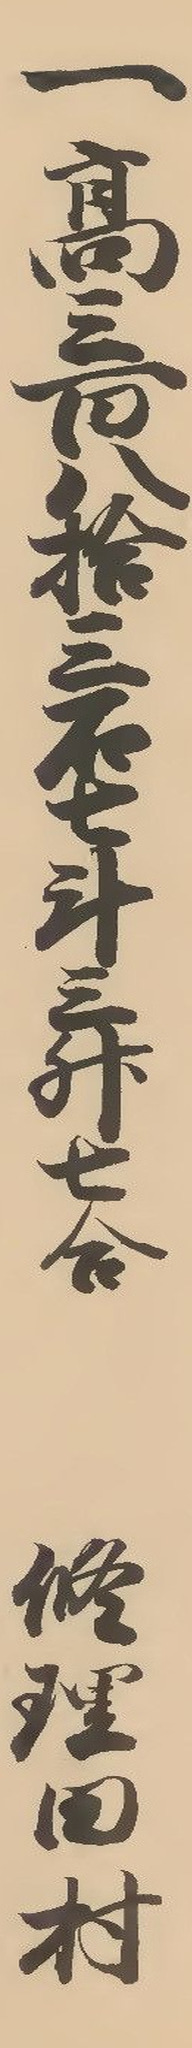一髙三百八拾三石七斗三升七合修理田村
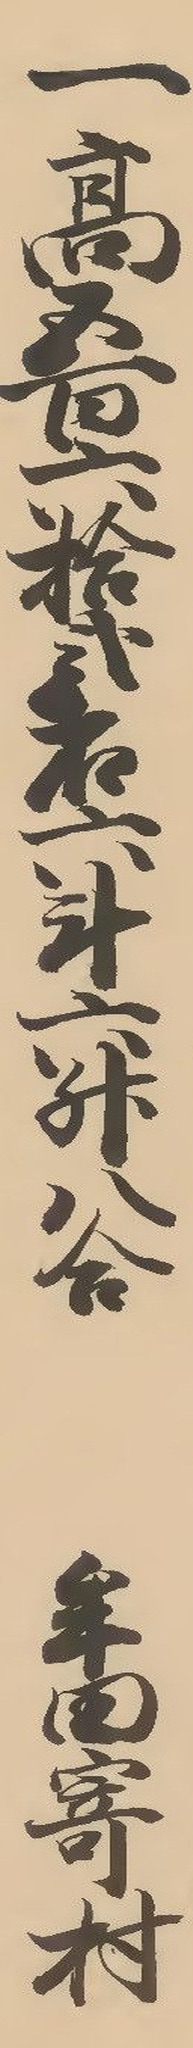一髙五百六拾弐石六斗六升八合牟田寄村

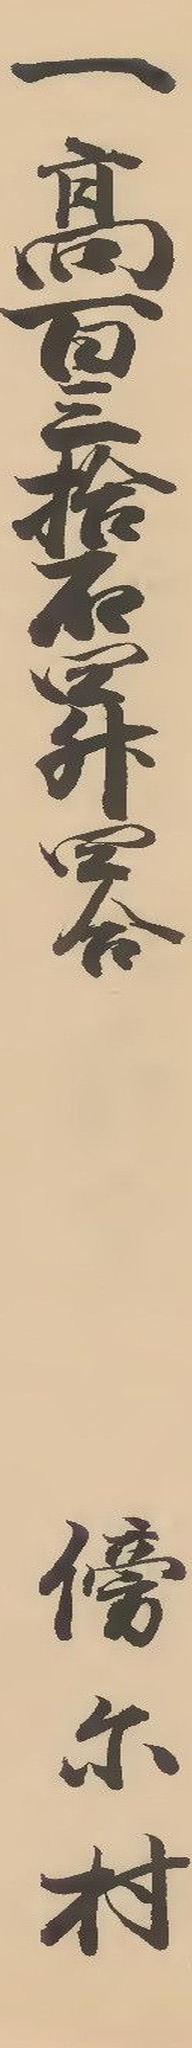一髙百三拾石四升四合傍村
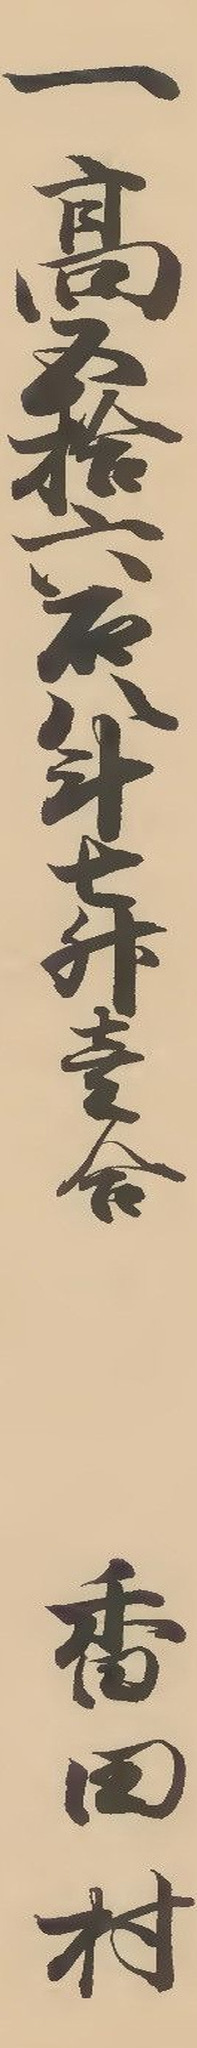一髙五拾六石八斗七升壱合香田村
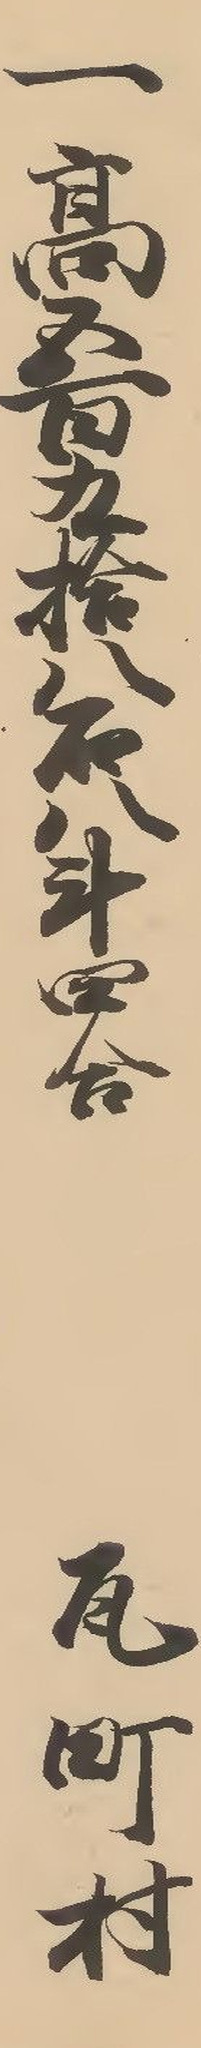一髙五百九拾八石八斗四合瓦町村
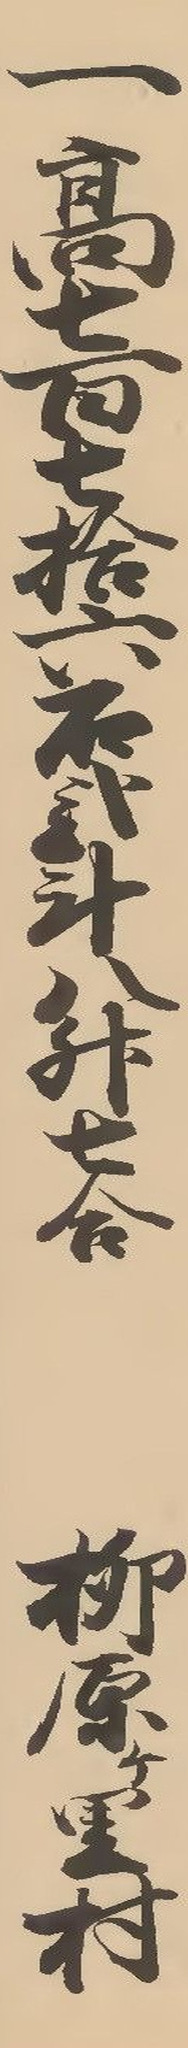一髙七百七拾六石弐斗八升七合柳原ケ里村
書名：肥前国郷帳
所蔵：国立公文書館 National Archives of Japan
